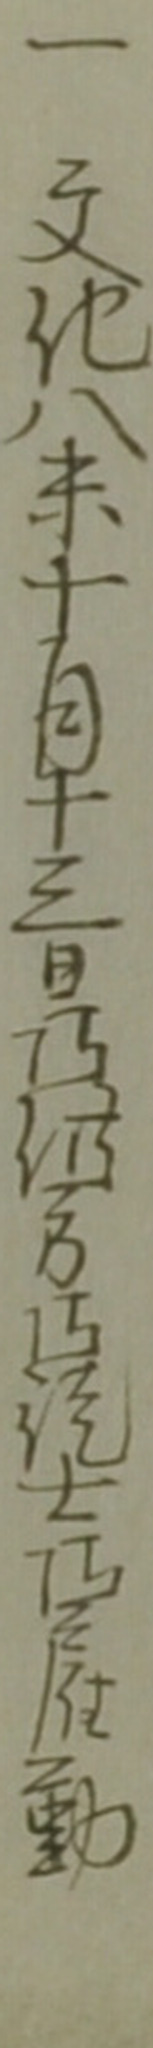一文化八未十月十三日御供方御徒士御雇勤
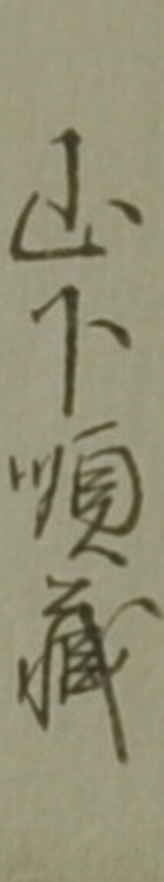山下順蔵
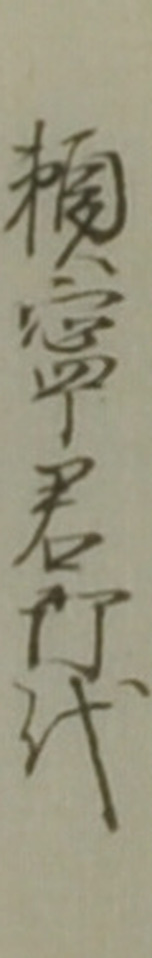頼寧君御代
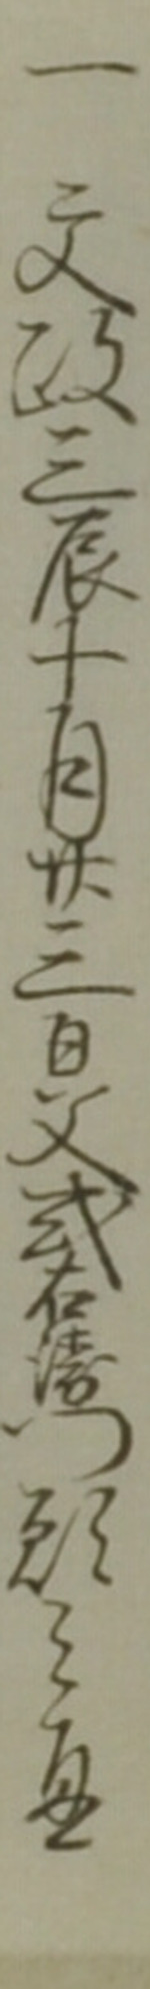一文政三辰十月廿三日父式右衛門願之通
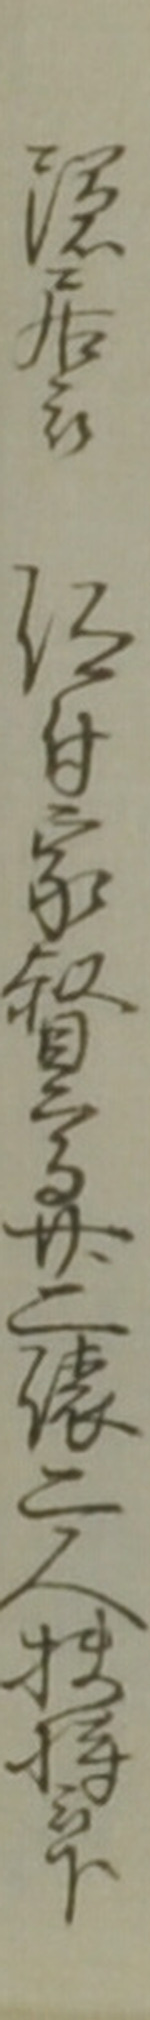隠居被仰付家督高廿二俵二人扶持被下
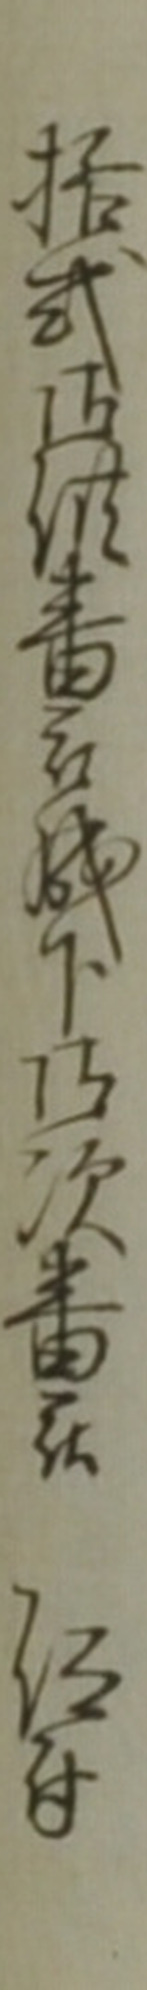格式御供番被成下御次番被仰付
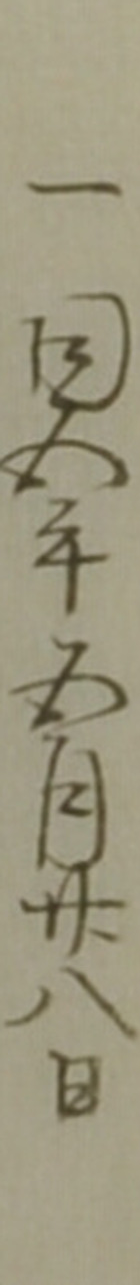一同五午五月廿八日
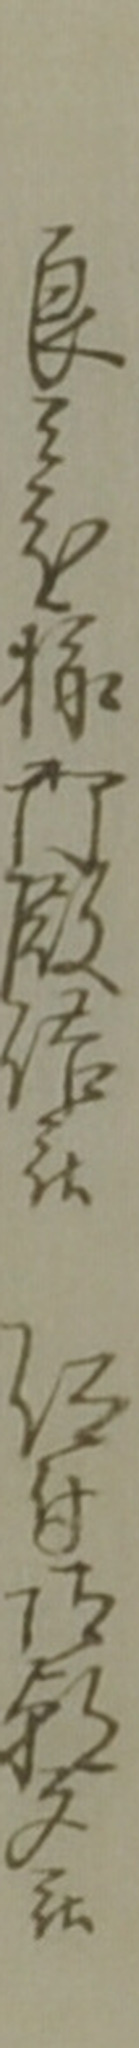良之進様御殿詰被仰付御朝夕被
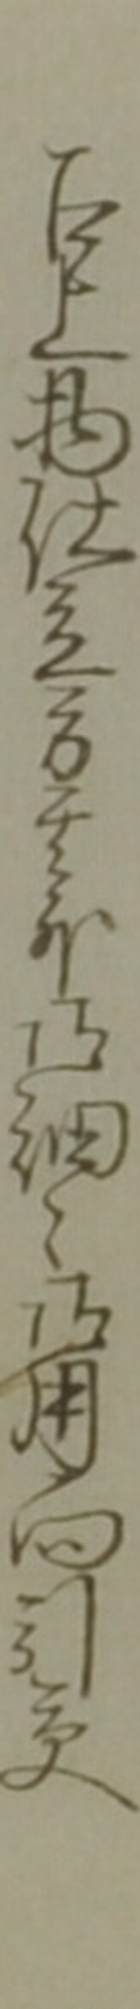召上物仕立方其外御細々御用向引受
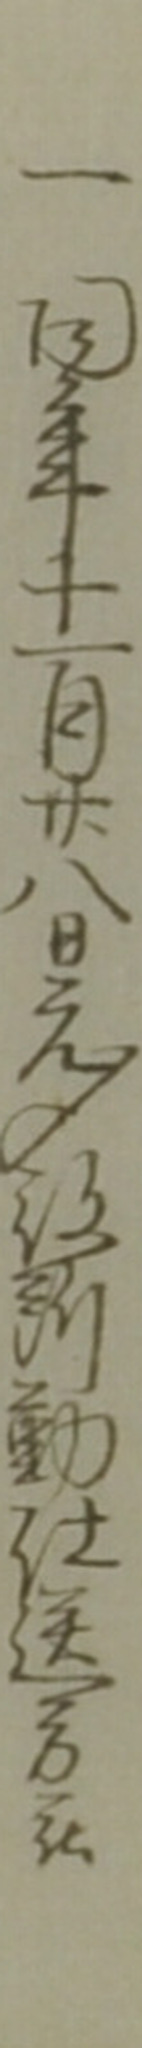一同年十一月廿八日元〆役所勤仕送方被
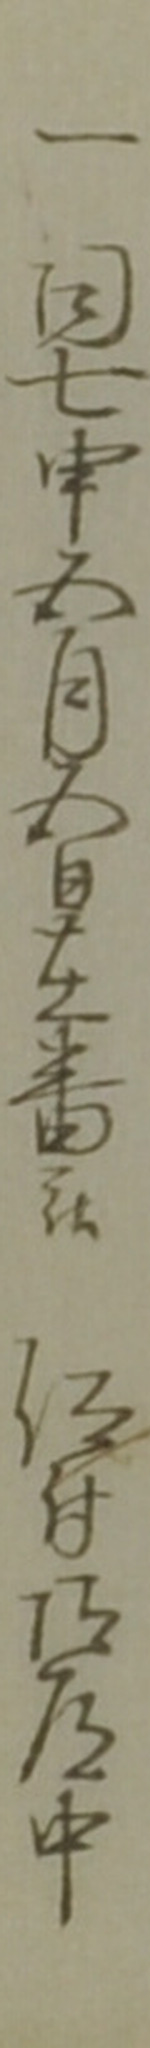一同七申五月五日在番被仰付御道中
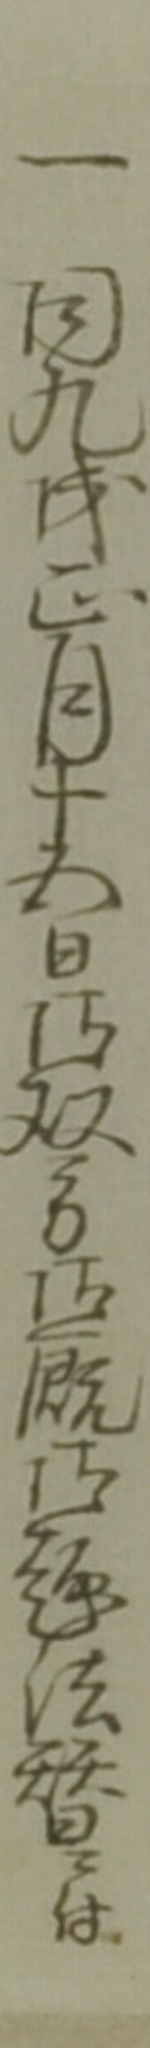一同九戌正月十五日御双方御厩御趣奉替ニ付
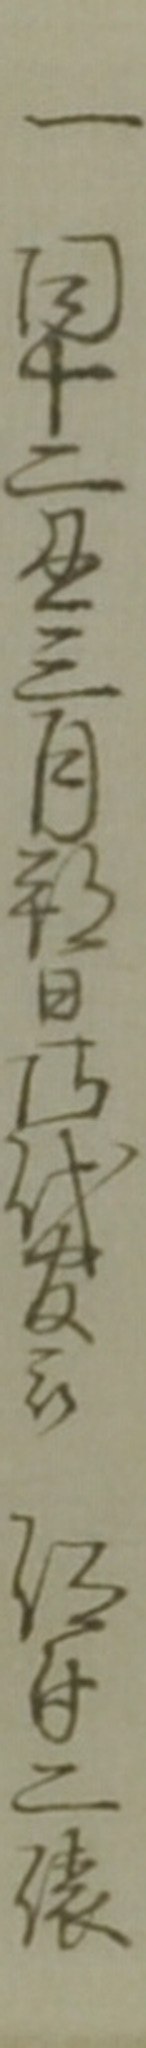一同十二丑三月朔日御代官被仰付二俵
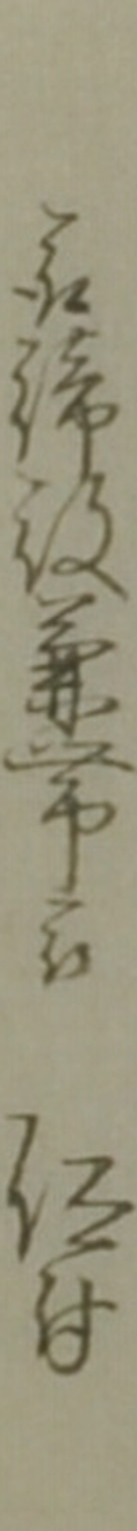取締役兼帯被仰付
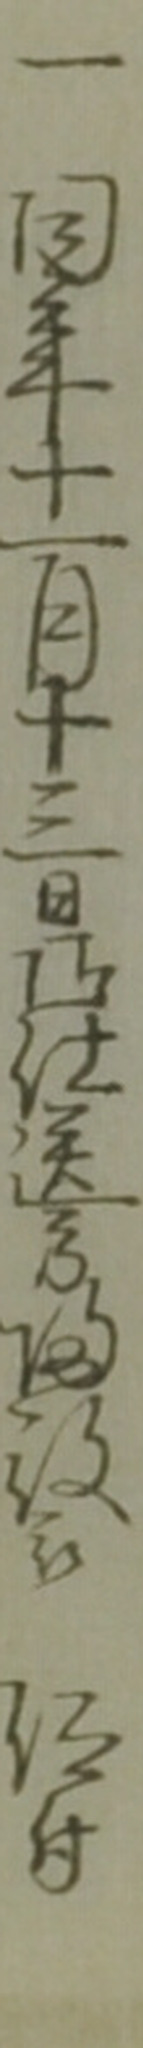一同年十一月十三日御仕送方帰役被仰付
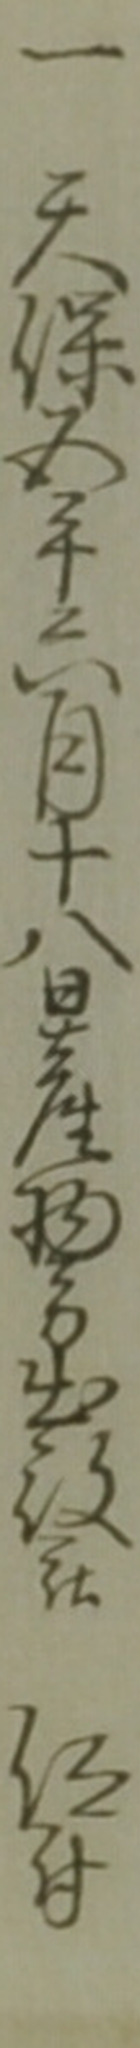一天保五午六月十八日産物方出役被仰付
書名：無足諸士勤仕録（二）
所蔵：伊那市立高遠町図書館・合同会社AMANE
